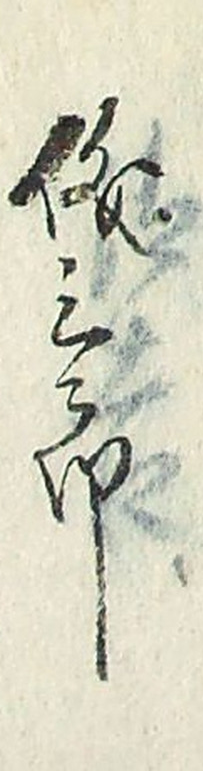儀三郎

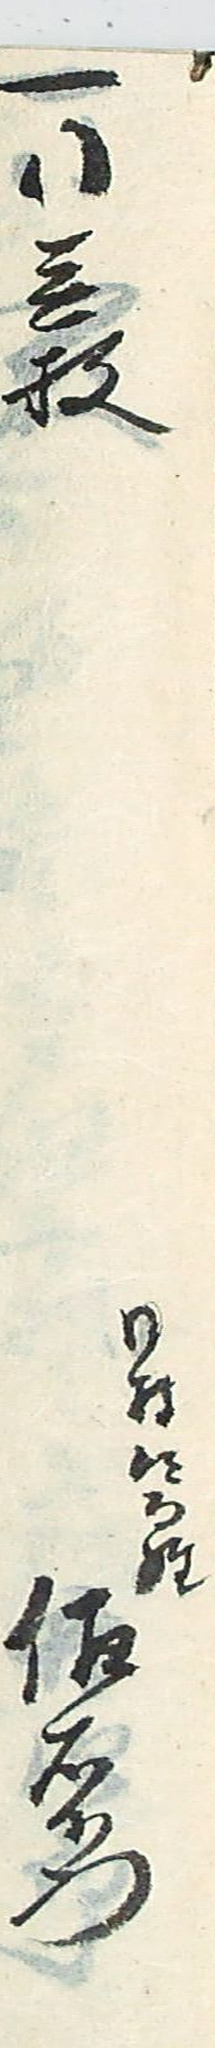一同壱枚同村頭百姓
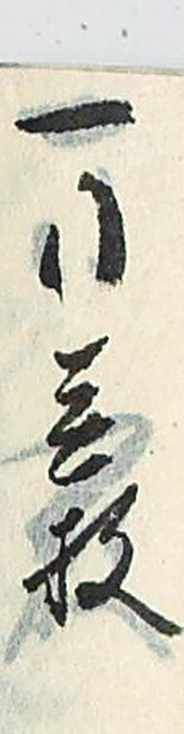一同壱枚同
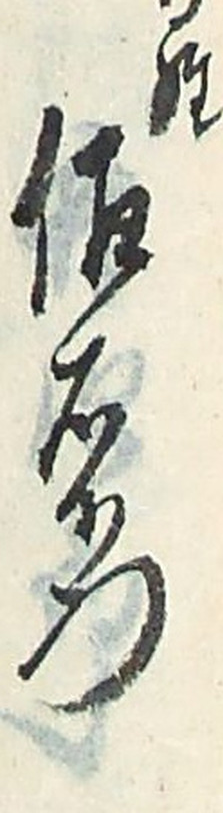佐右衛門
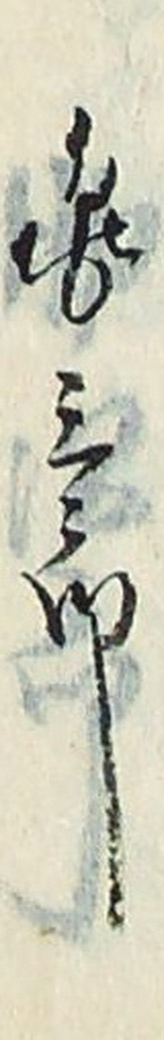亀三郎
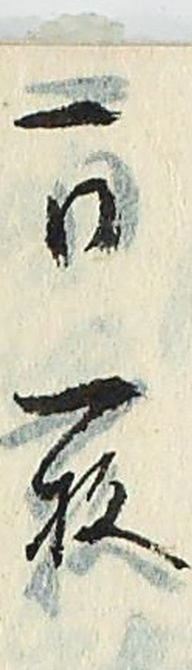一同一枚同
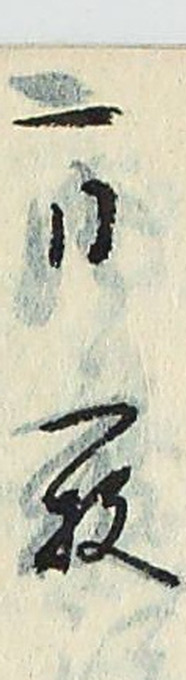一同一枚同
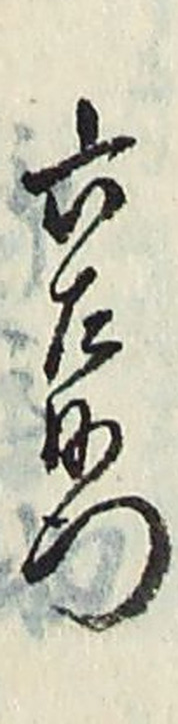六左衛門
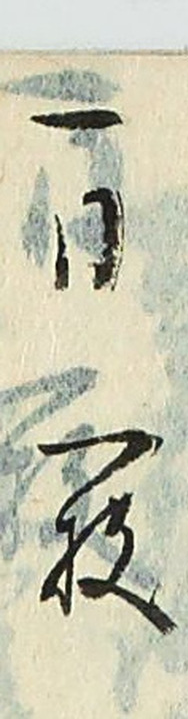一同一枚同
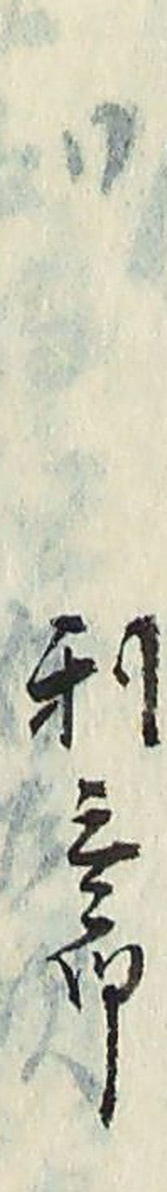利三郎
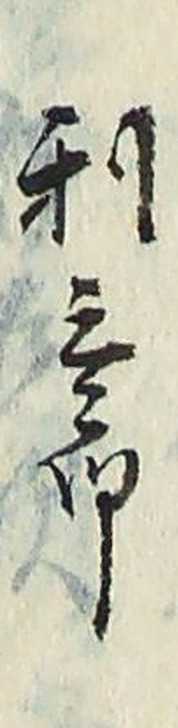利三郎
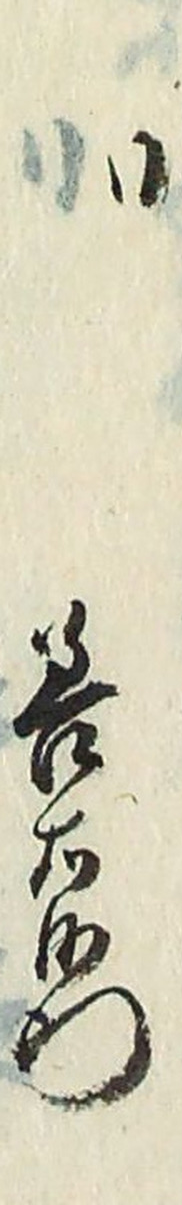善右衛門
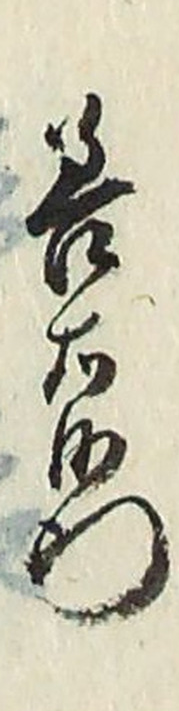善右衛門
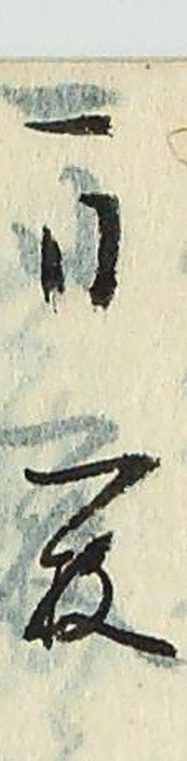一同一枚同
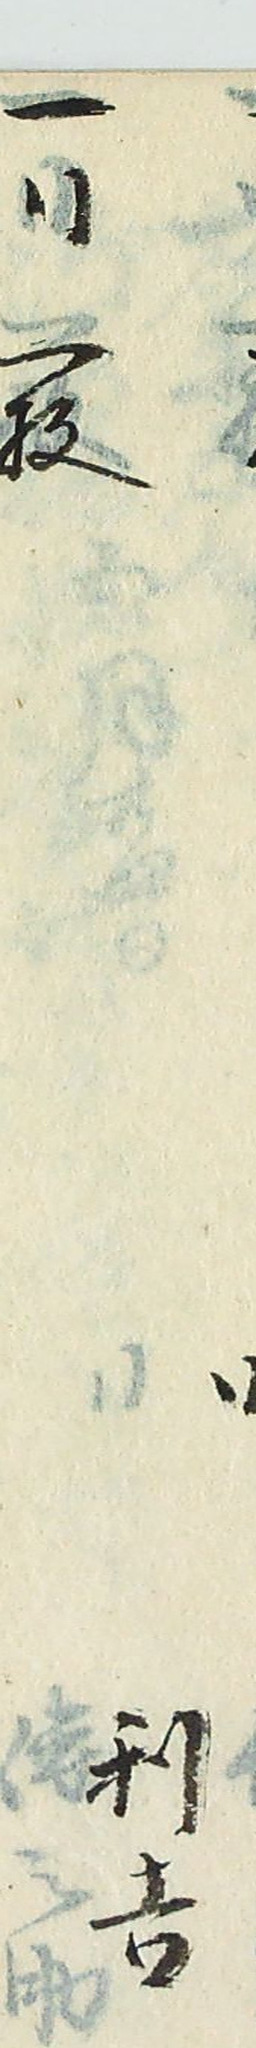一同一枚同
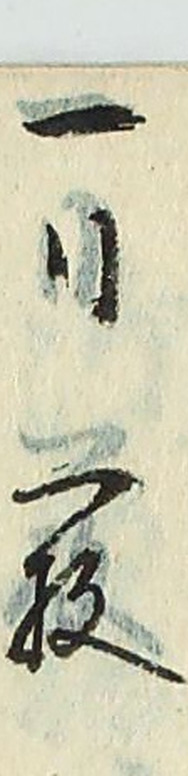一同一枚同
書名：諸御用御□受書控
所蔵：鳴門教育大学 Naruto University of Education
